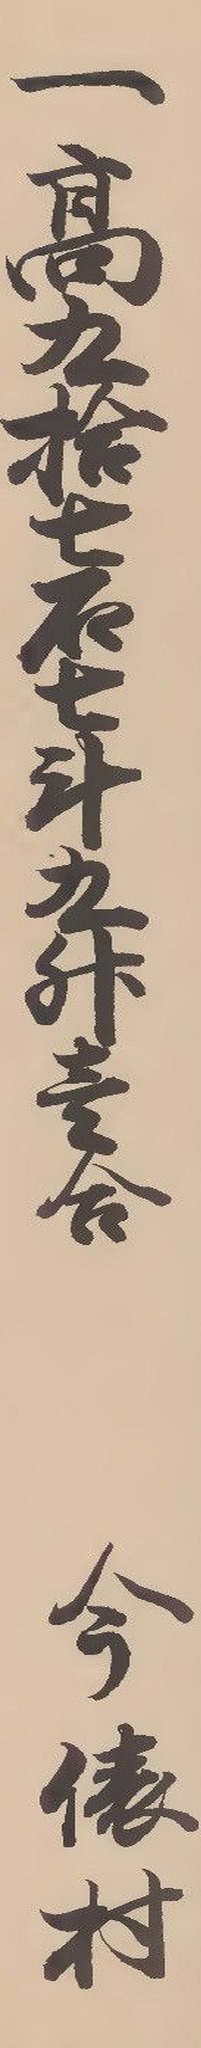一高九拾七石七斗九升壱合今俵村
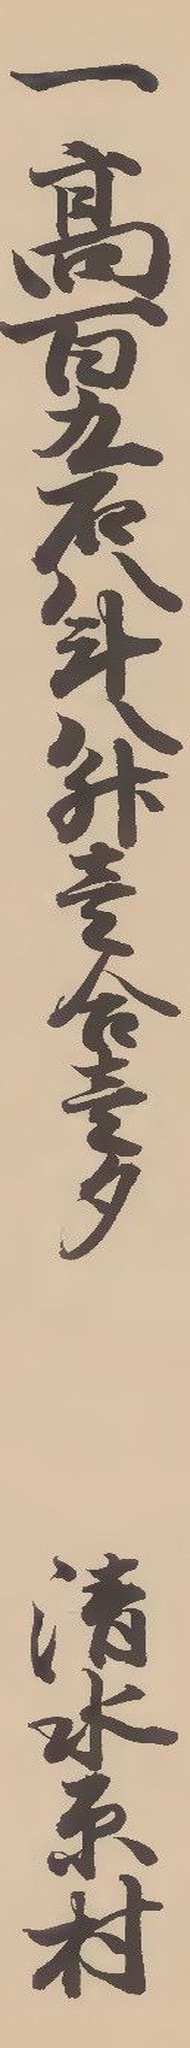一高百九石八斗八升壱合壱勺清水原村
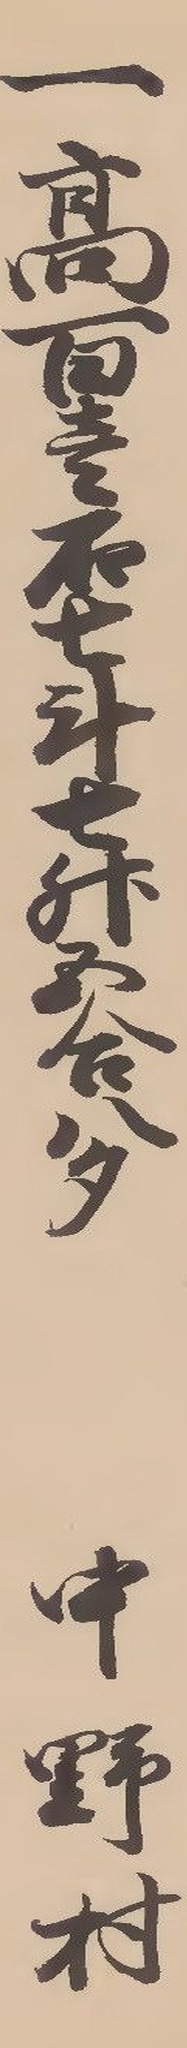一高百壱石七斗七升五合八勺中野村
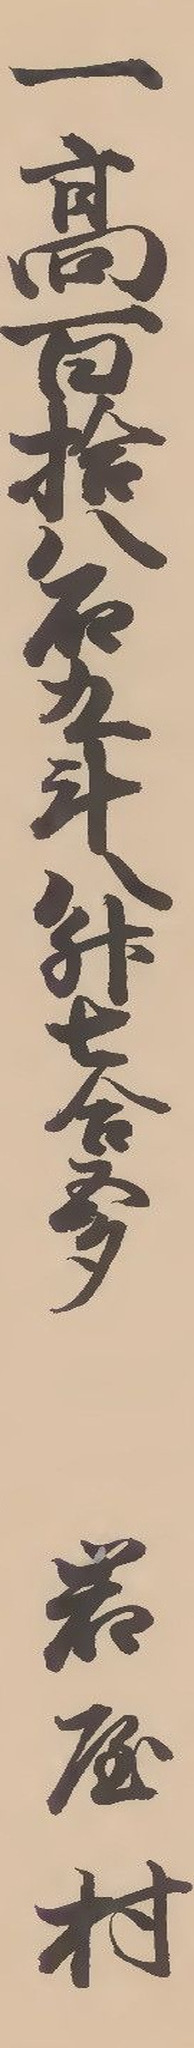一高百拾八石九斗八升七合五勺岩屋村

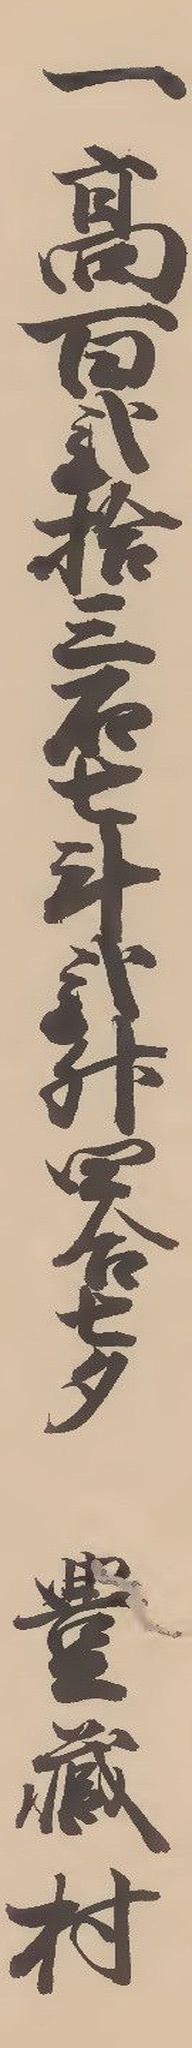一高百弐拾三石七斗弐升四合七勺豊蔵村
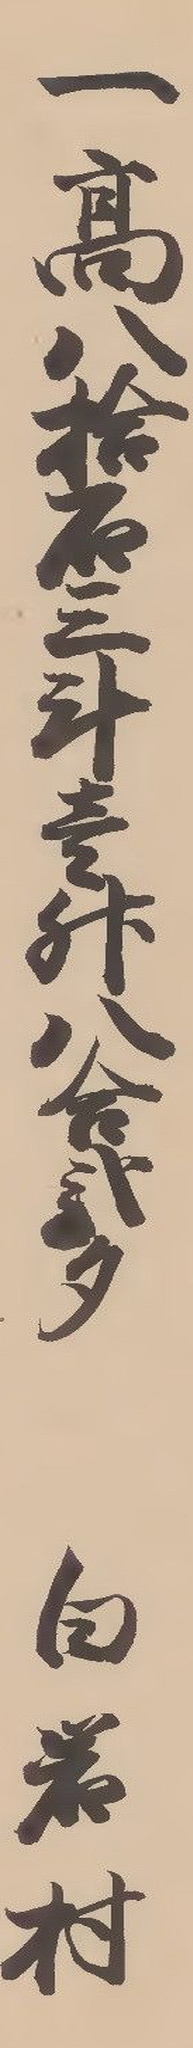一高八拾石三斗壱升八合弐勺白岩村
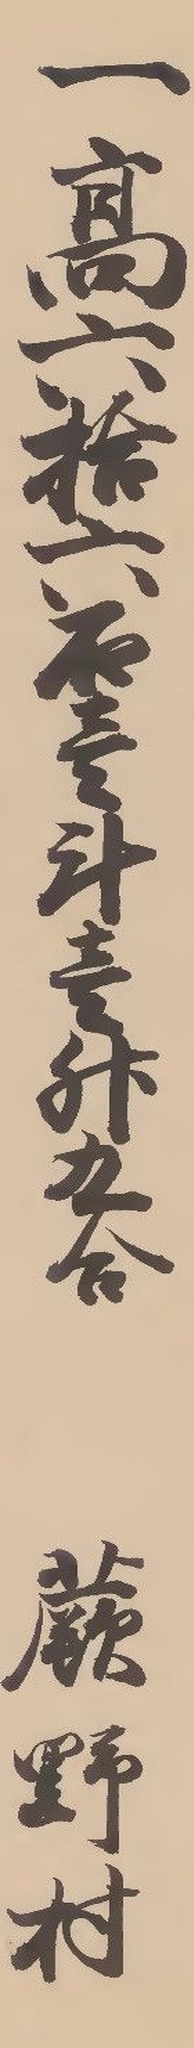一高六拾六石壱斗壱升九合蕨野村
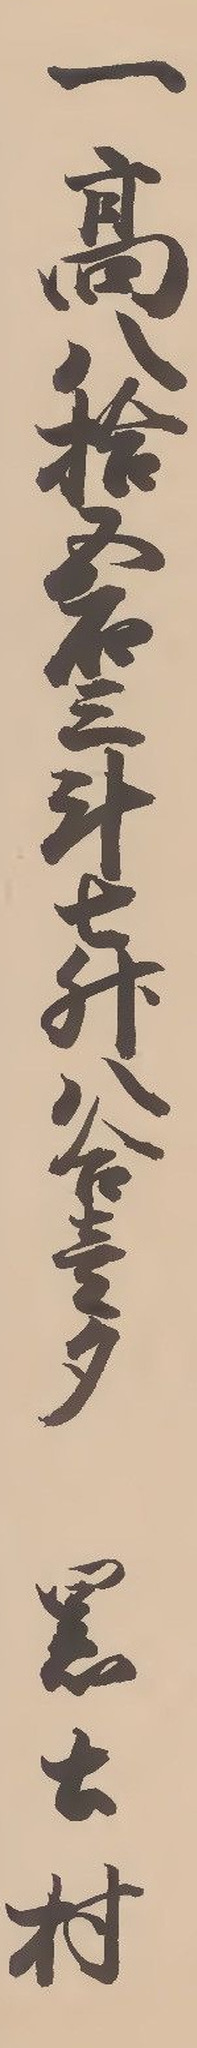一高八拾五石三斗七升八合壱勺黒土村
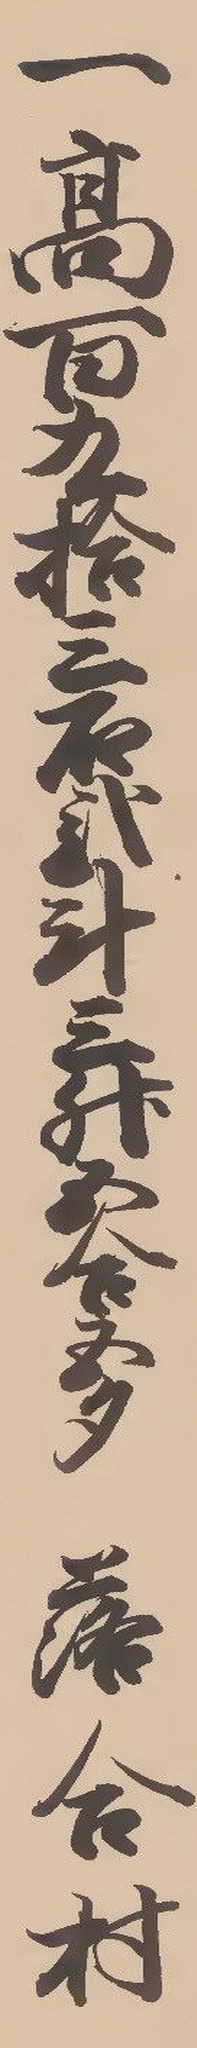一高百九拾三石弐斗三升五合五勺落合村
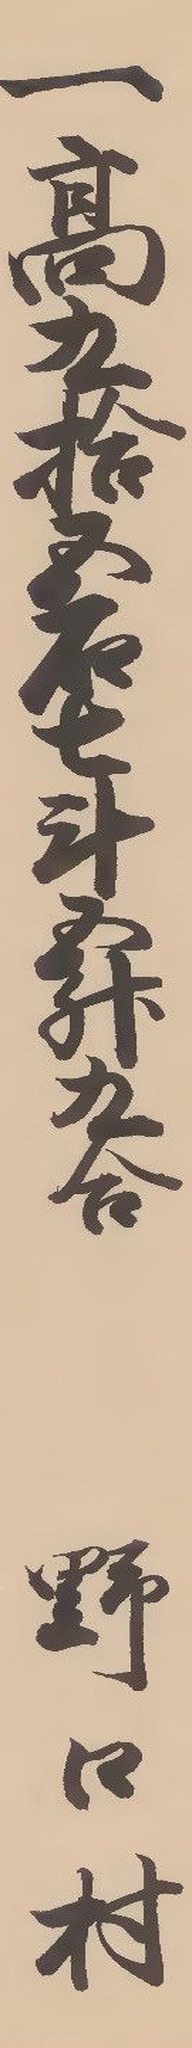一高九拾五石七斗五升九合野口村
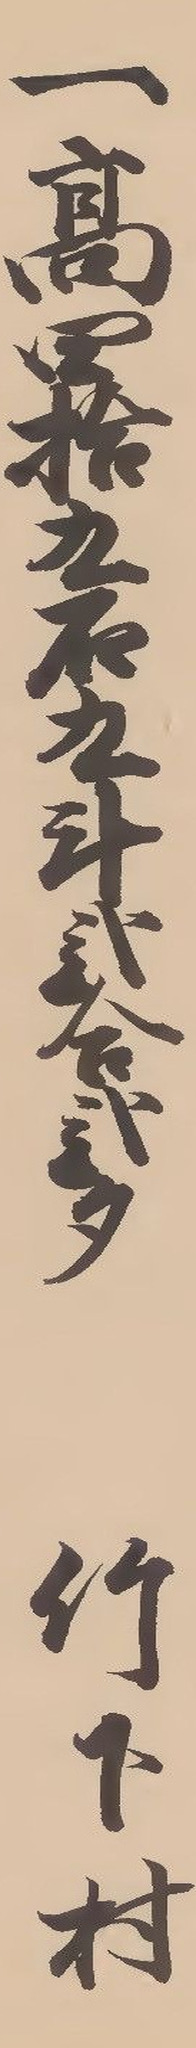一高四拾九石九斗弐合弐勺竹下村
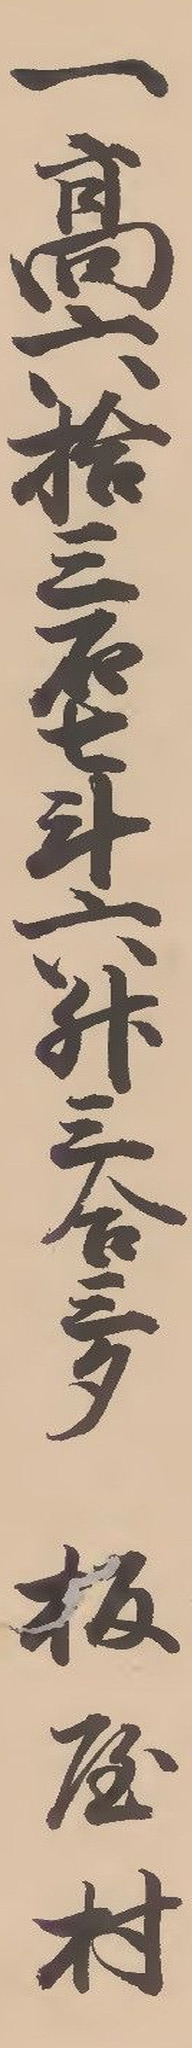一高六拾三石七斗六升三合三勺板屋村

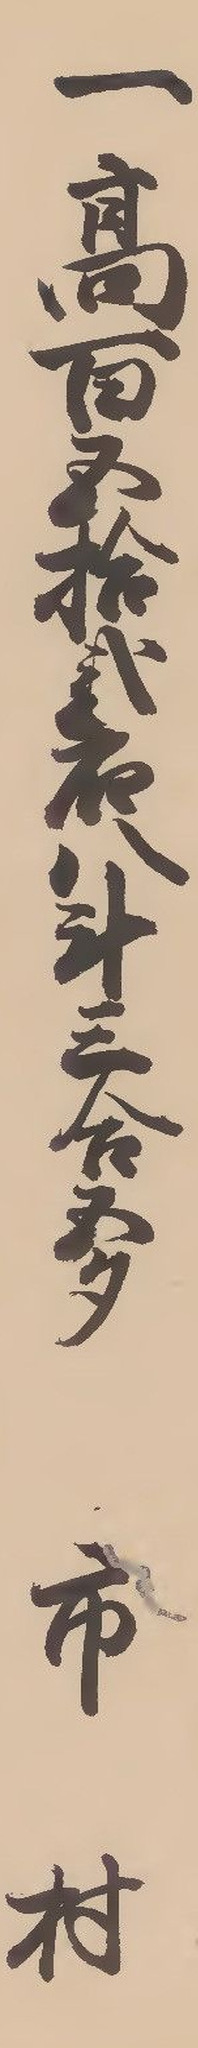一高百五拾弐石八斗三合五勺市村
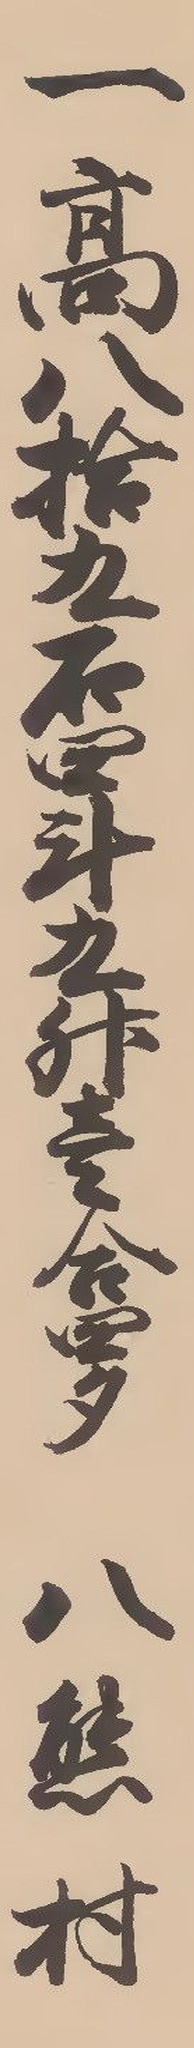一高八拾九石四斗九升壱合四勺八熊村
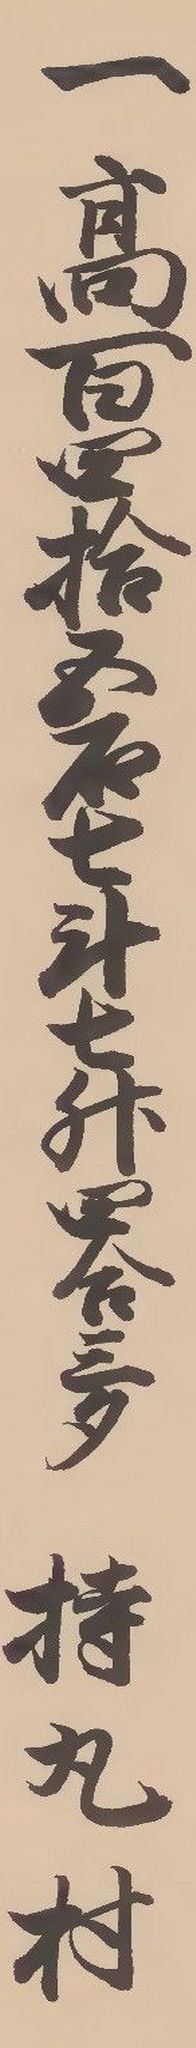一高百四拾五石七斗七升四合三勺持丸村
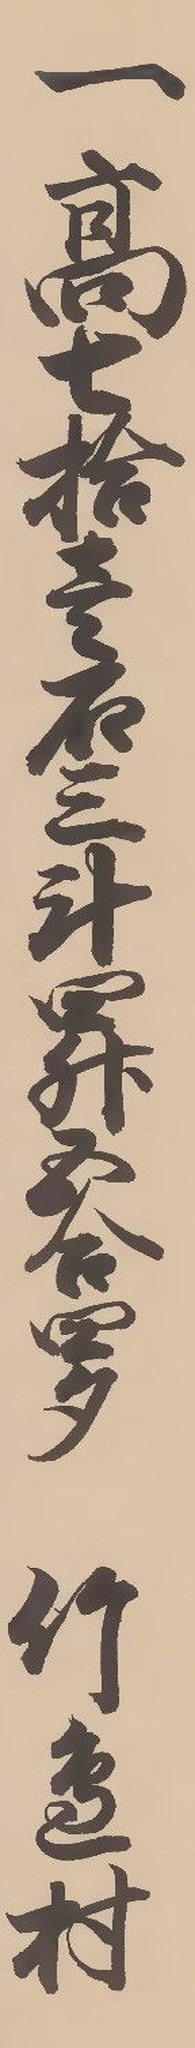一高七拾壱石三斗四升五合四勺竹辺村
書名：豊後国郷帳
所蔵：国立公文書館 National Archives of Japan
